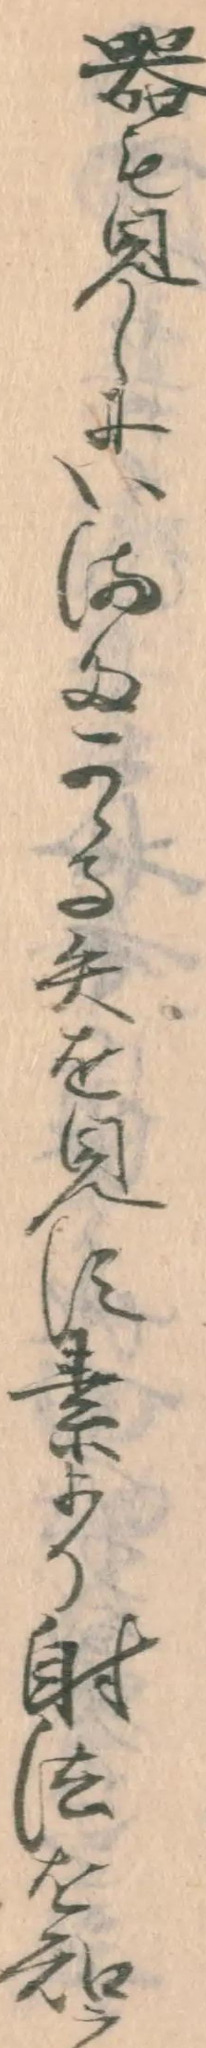器も見しにいまたかゝる矢を見す素かり射法を知ら
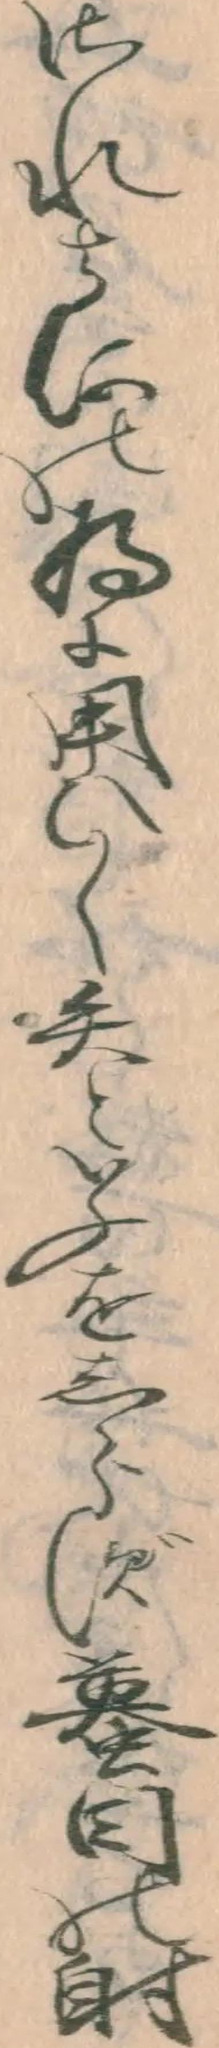されは何の為に用ひし矢といふをしらず蟇目の射
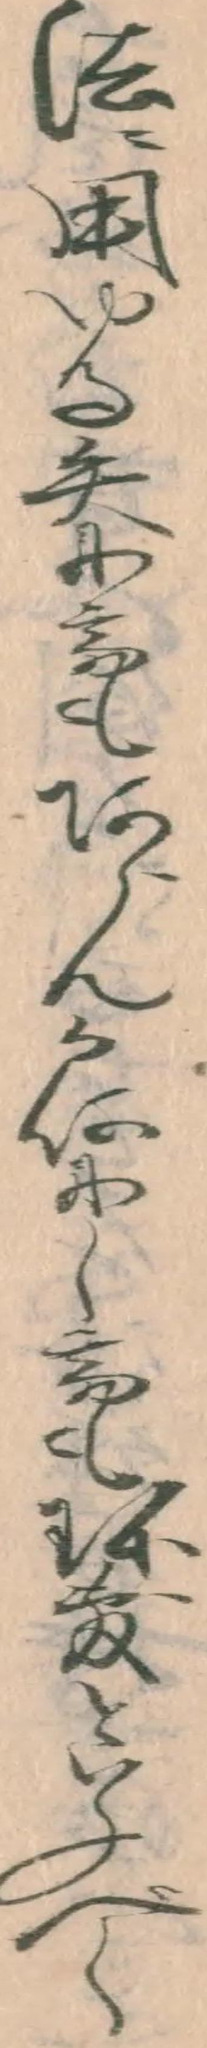法に用ゆる矢にてもあらんか何にしても珍敷といふへし
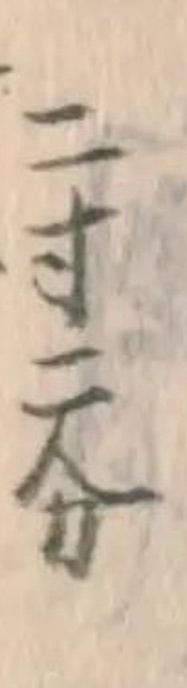二寸二分
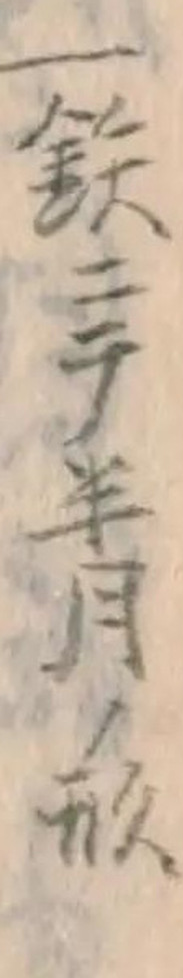鉄ニテ半月ノ形
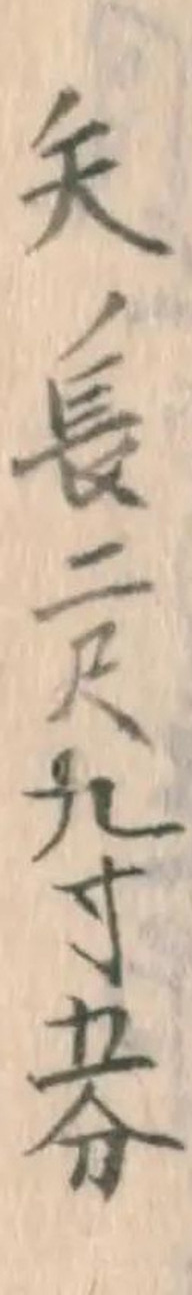矢ノ長二尺九寸五分
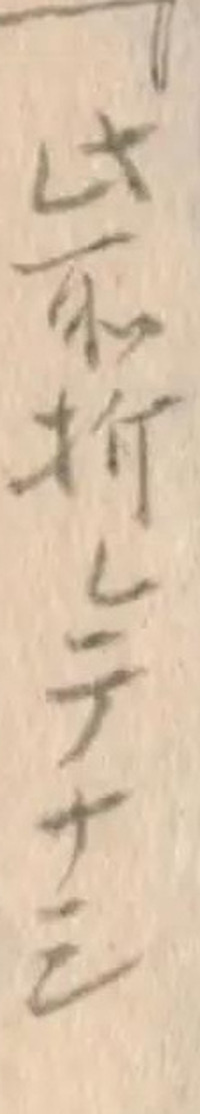此所折レテナシ
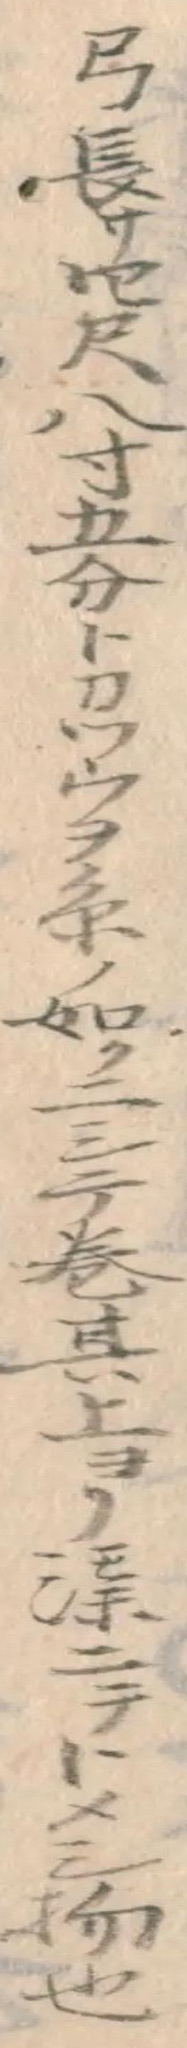弓長サ四尺八寸五分トカツウヲ糸ノ如クニシテ巻其上ヨリ漆二テトメシ物也
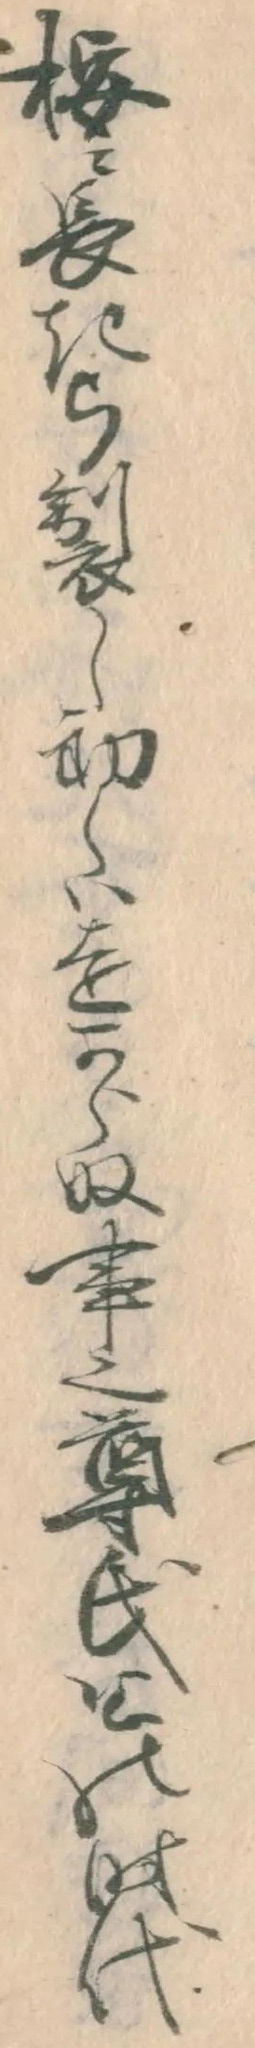按に長き弓製し初しは遠からぬ事也尊氏公の時代

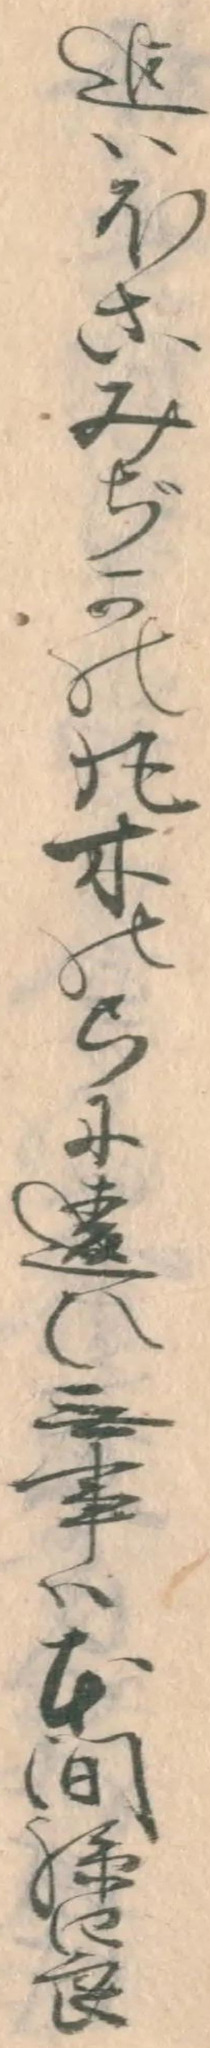迄はほこみぢかの丸木の弓に違ひ無事は本間孫四郎
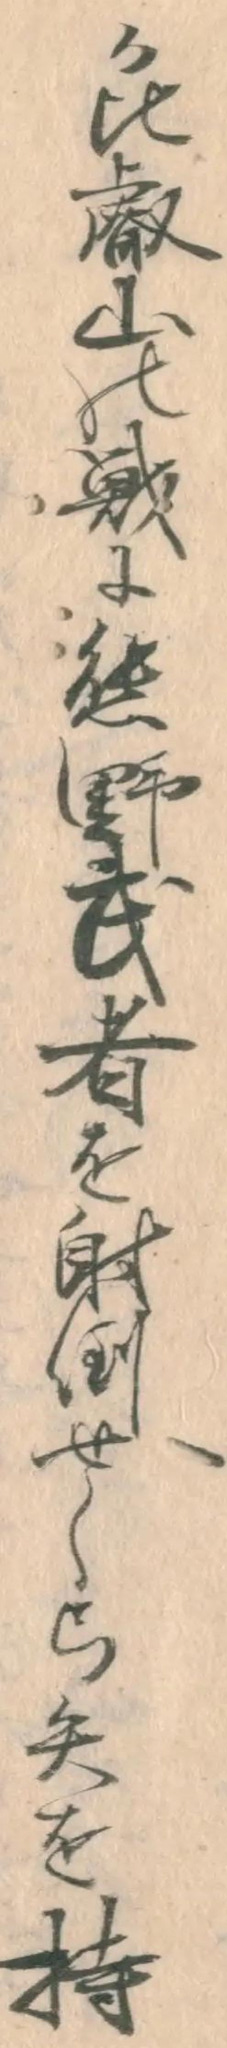か比叡山の戦に熊野武者を射倒せく弓矢を持
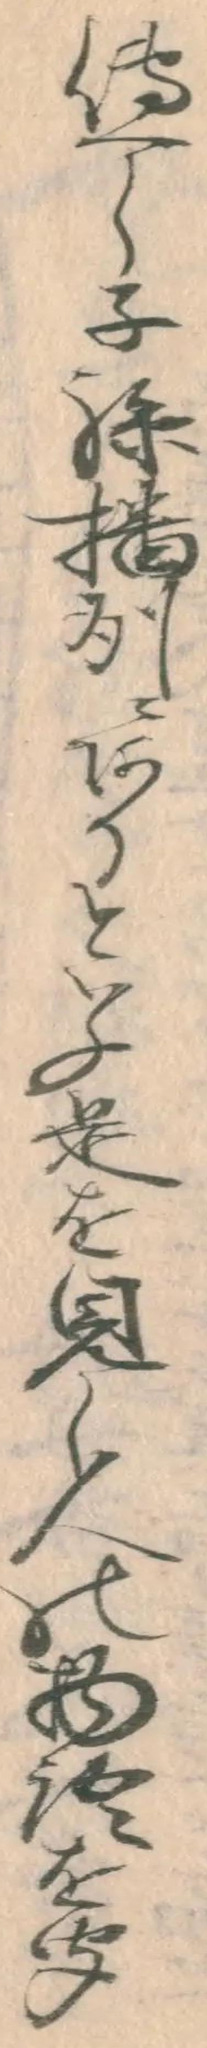伝へし子孫播州にありといふ是を見し人の物語を聞
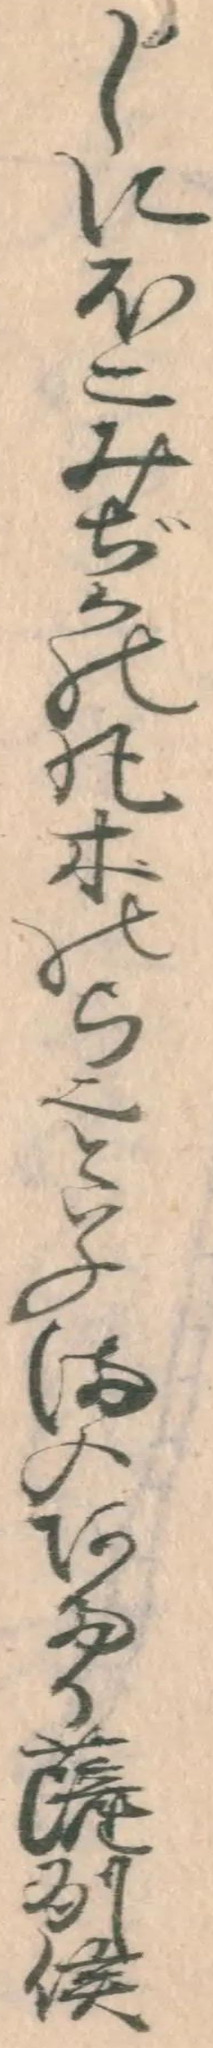しにほこみぢかの丸木の弓也といふまのあたり薩州侯
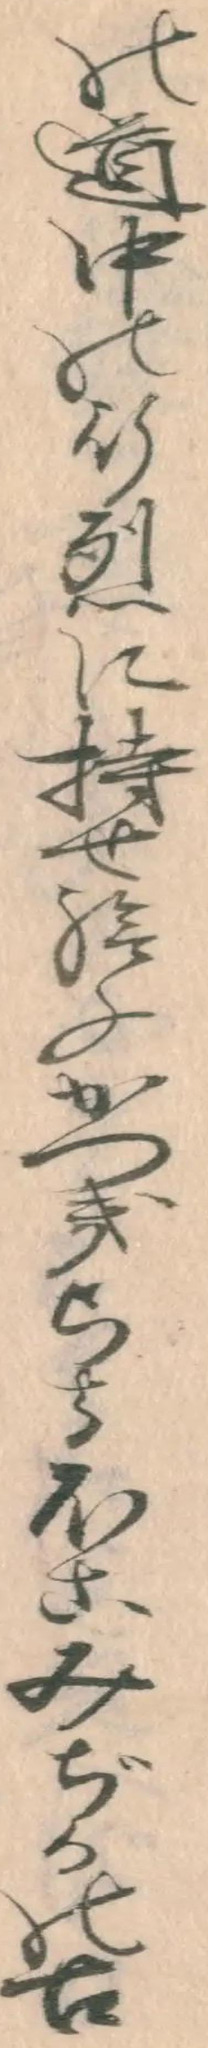の道中の行烈に持せ給ふかつき弓はほこみぢかの古
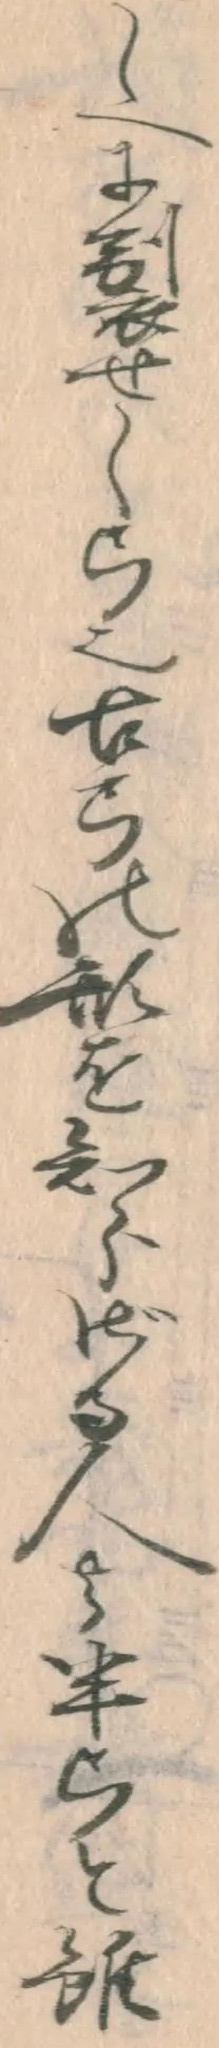しへに製せし弓也古弓の形を知らざる人は半弓と雖
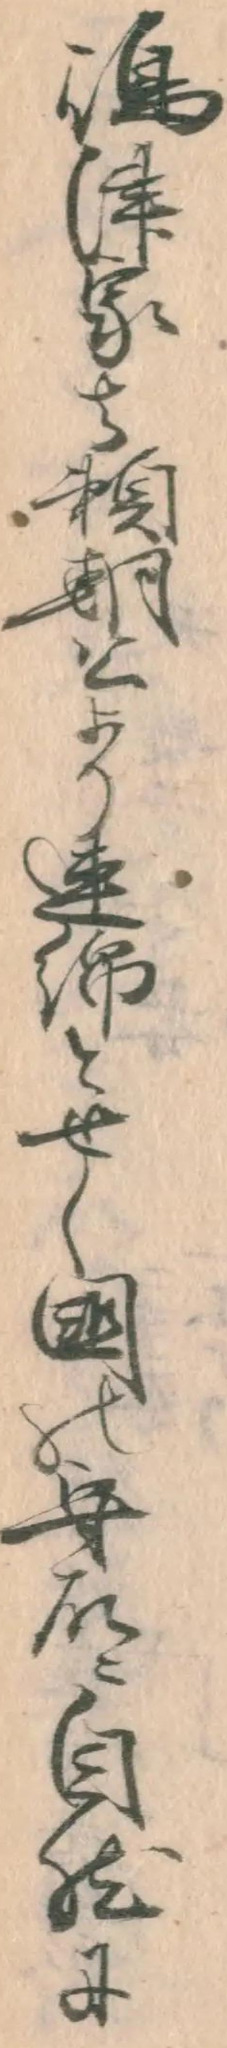島津家は頼朝公より連綿とせし国の守故に自然に
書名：四神地名録 6巻. [4]葛飾郡
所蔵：国立国会図書館 National Diet Library, JAPAN
